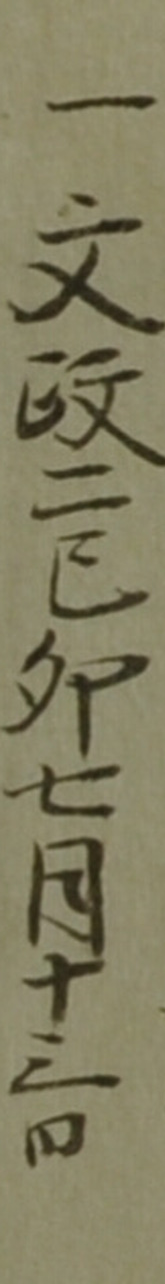一文政二己卯七月十三日
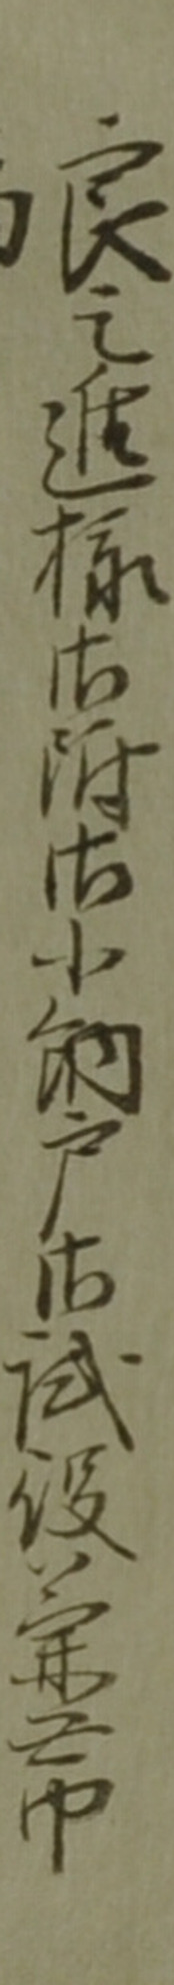良之進様御附御小納戸御試役兼帯
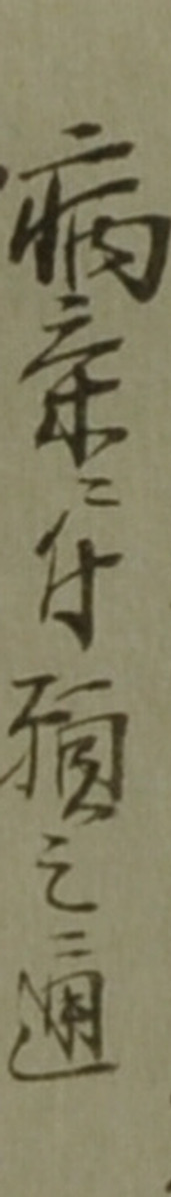病気ニ付願之通
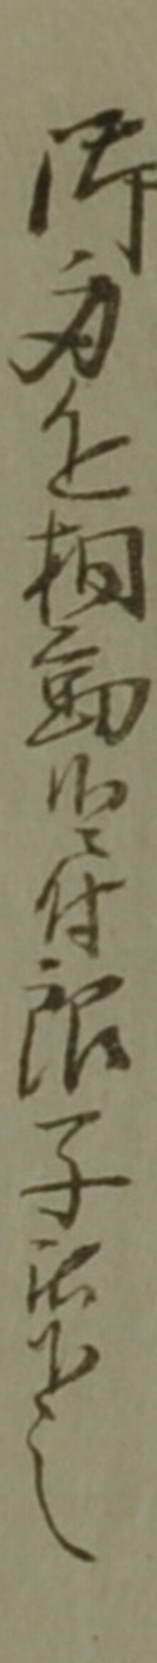御身を相勤候ニ付銀子被下之
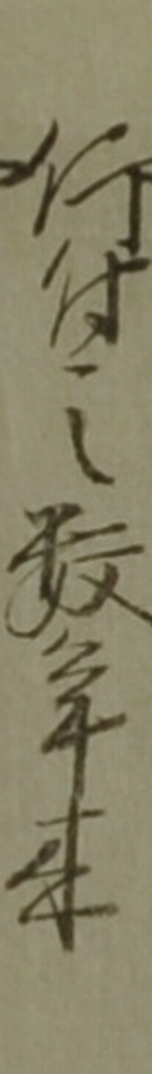仰付之数年来
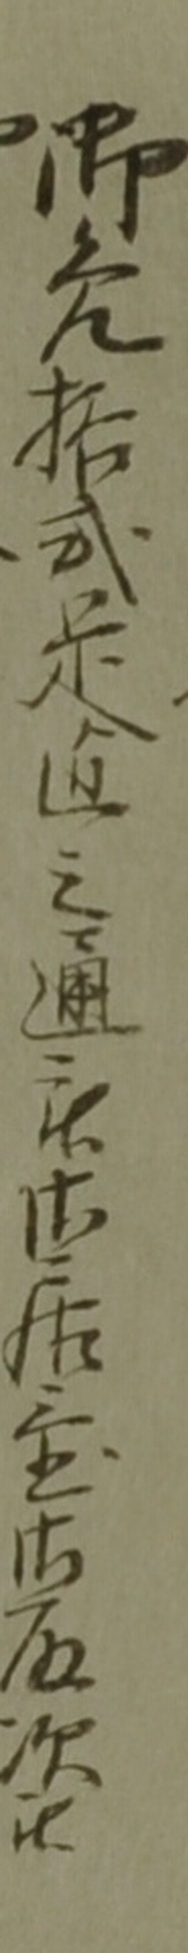御免格式是迄之通被御居置御取次被
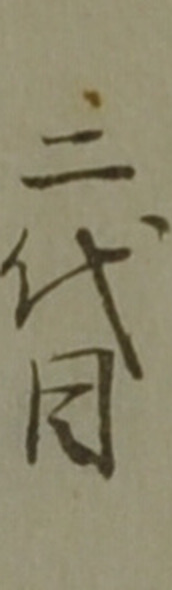二代目
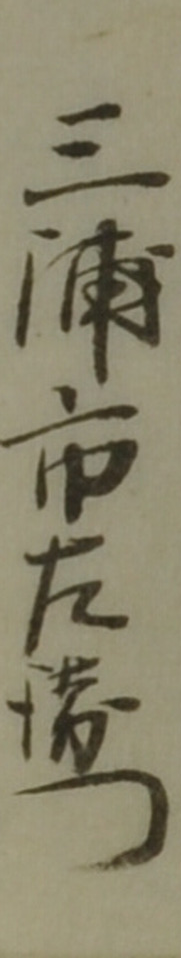三浦市左衛門
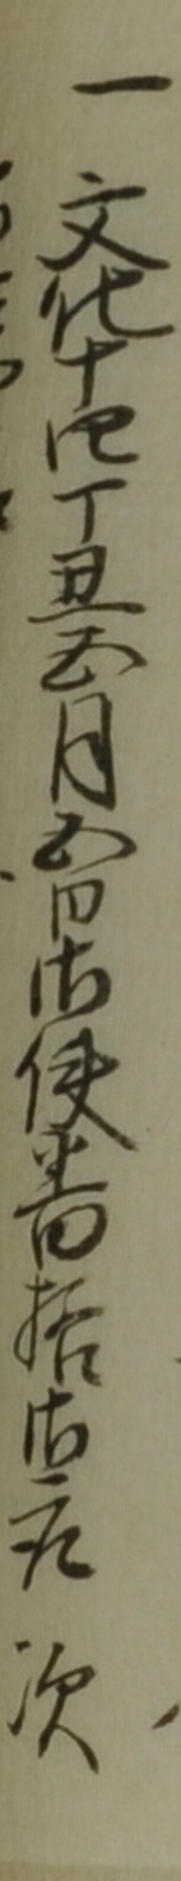一文化十四丁丑五月五日御使番格御取次
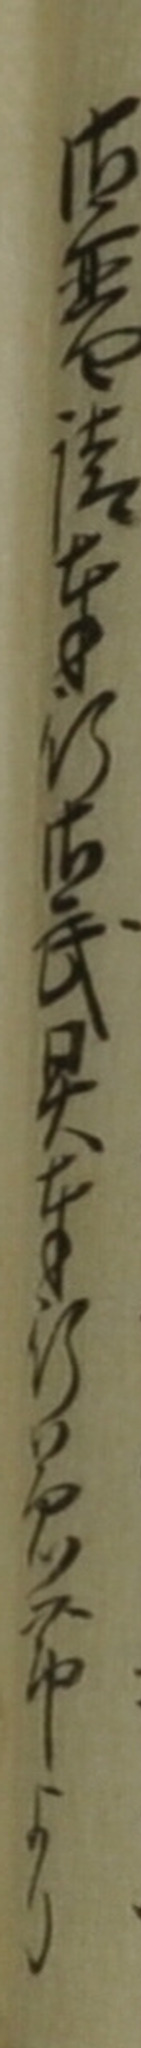御普請奉行御武具奉行兼帯より
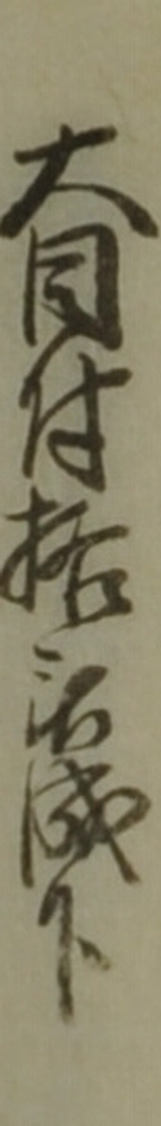大目付格被成下
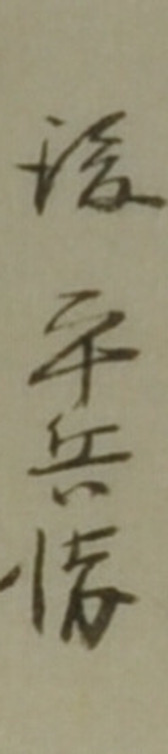後平兵衛
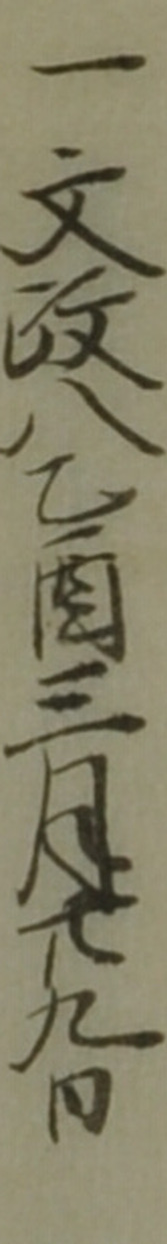一文政八乙酉三月廿九日
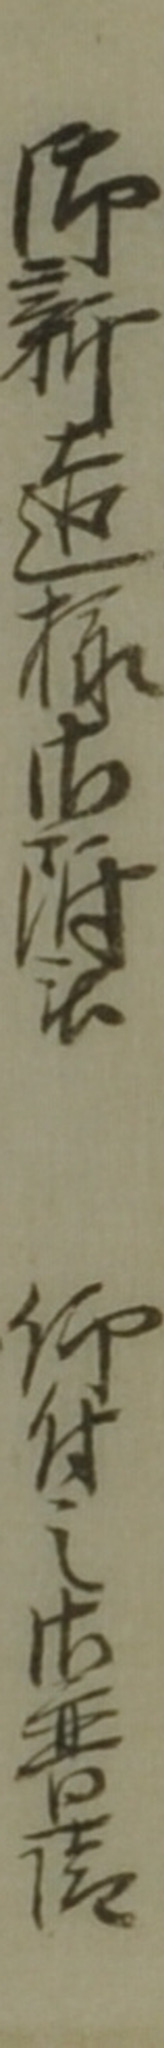御新造様御附被仰付之御普請
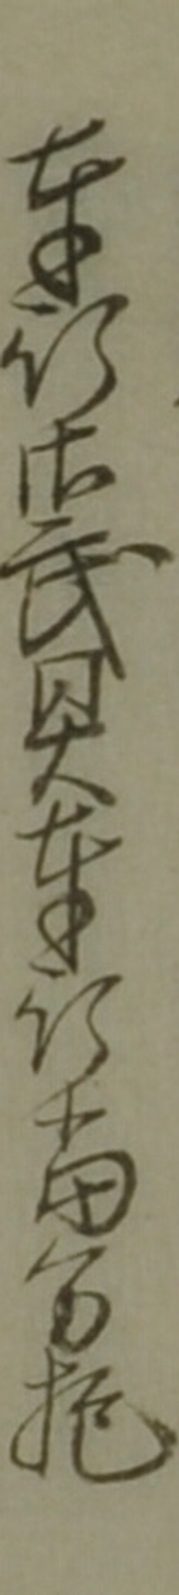奉行御武具奉行当分抱
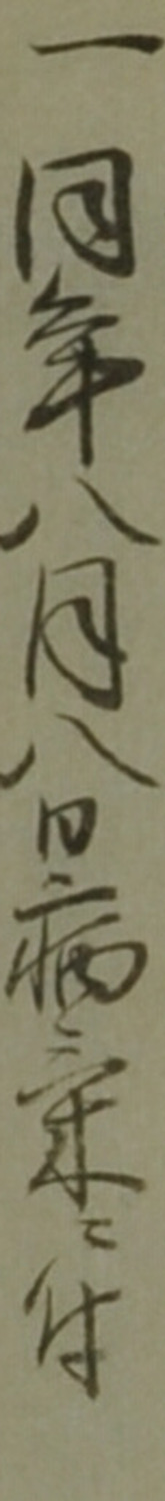一同年八月八日病気ニ付
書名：諸御役代々録（六）
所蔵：伊那市立高遠町図書館・合同会社AMANE
